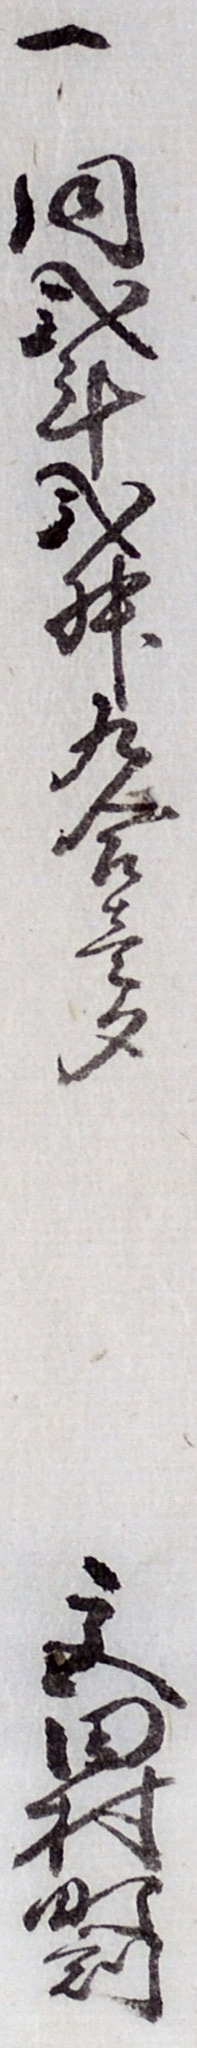一同弐斗弐升九合壱勺宮田村町割
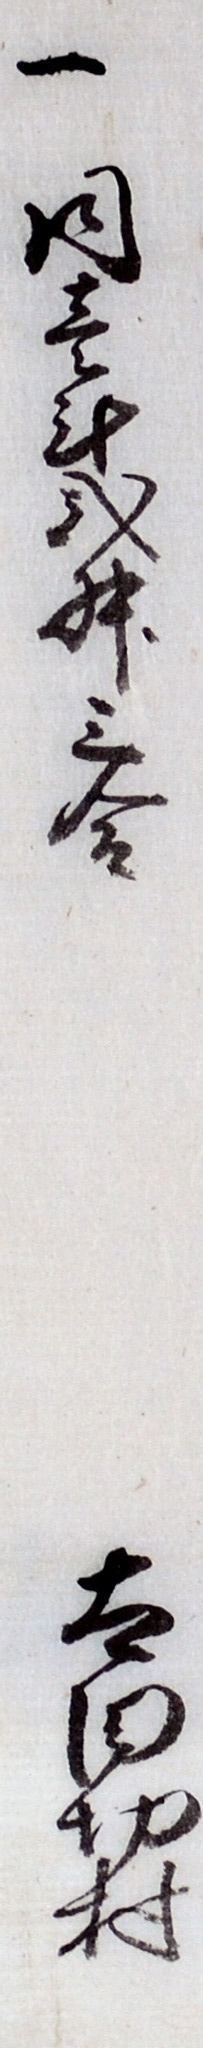一同壱斗弐升三合太田切村
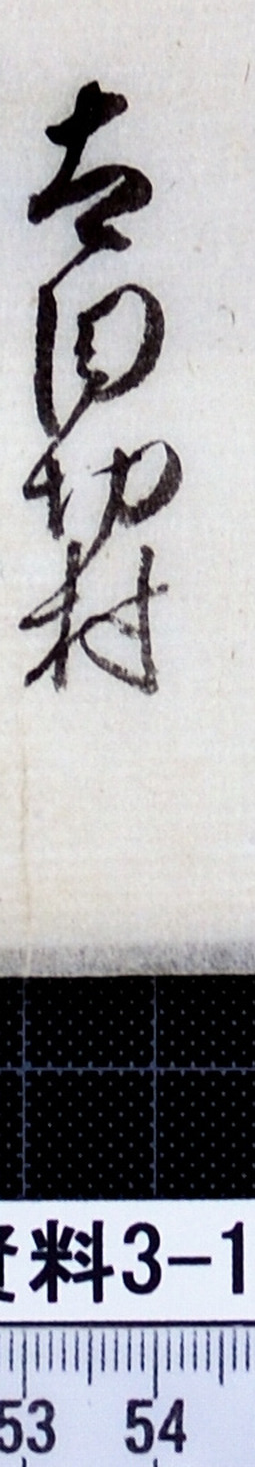太田切村
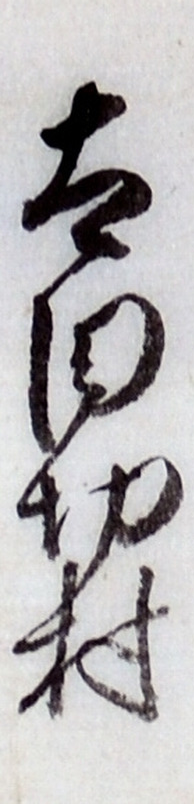太田切村
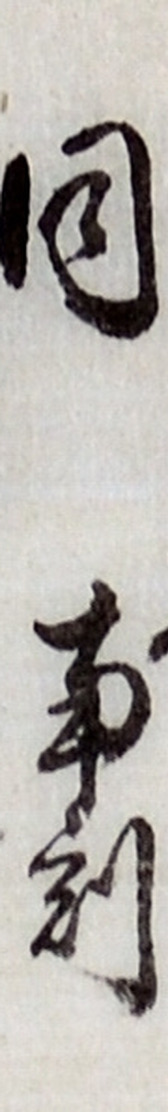同南割
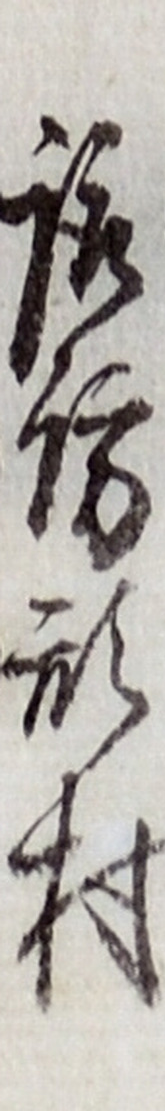諏訪形村
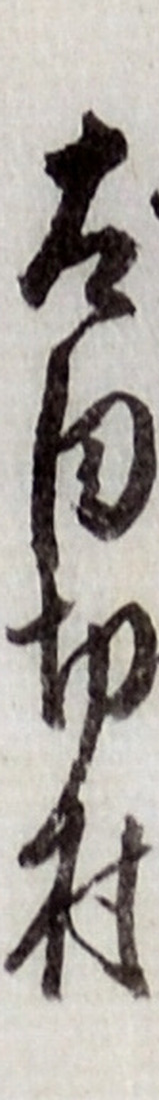太田切村
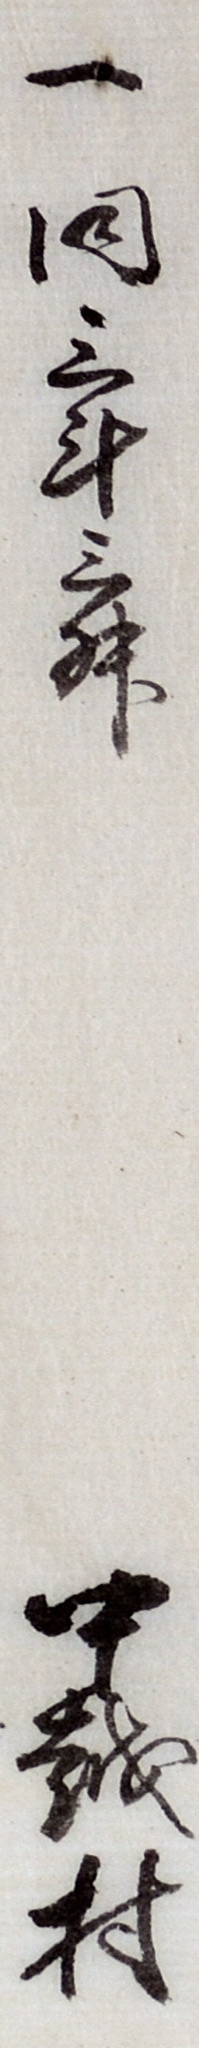一同三斗三升中越村
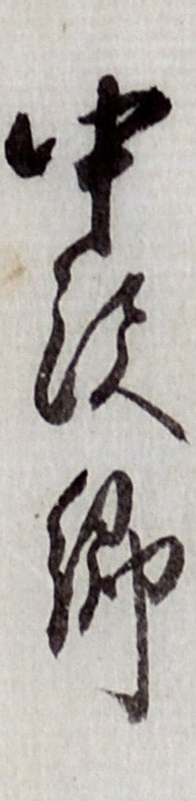中沢郷
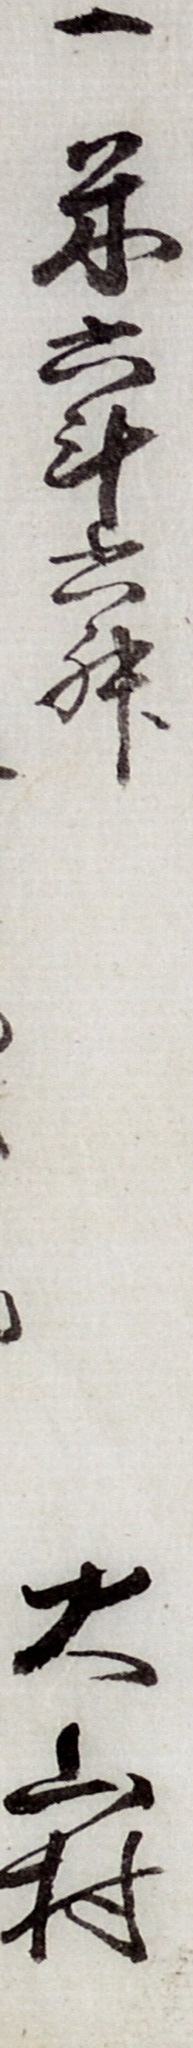一米六斗六升火山村
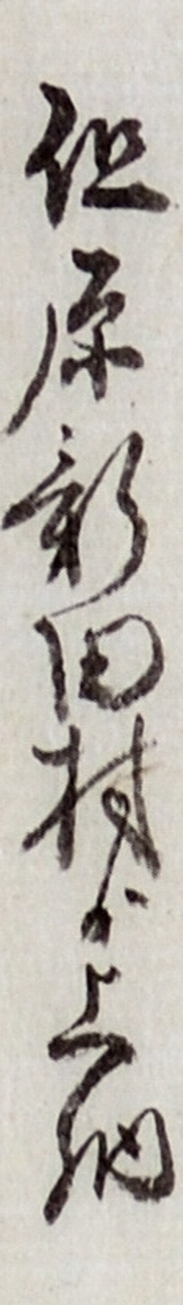但原新田村ゟ上納

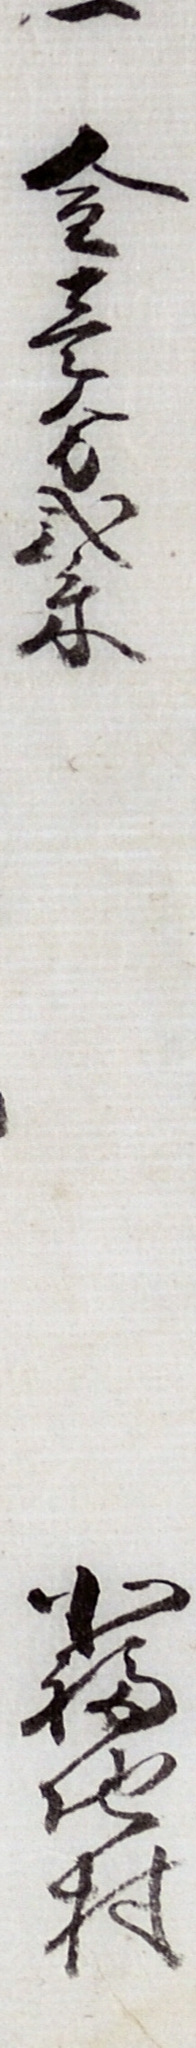一金壱分弐朱北福地村
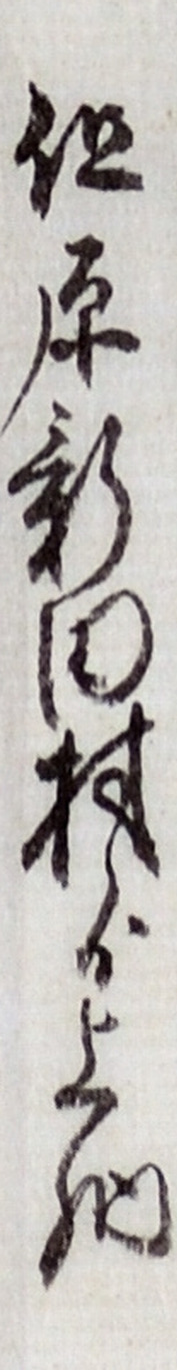但原新田村ゟ上納
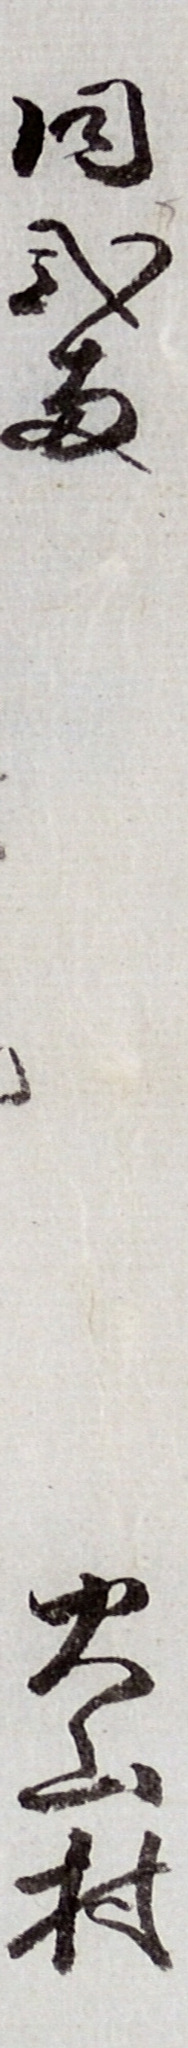一同弐両火山村
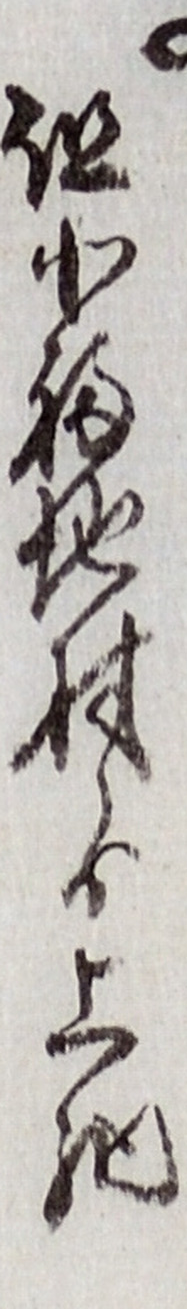但北福地村ゟ上納
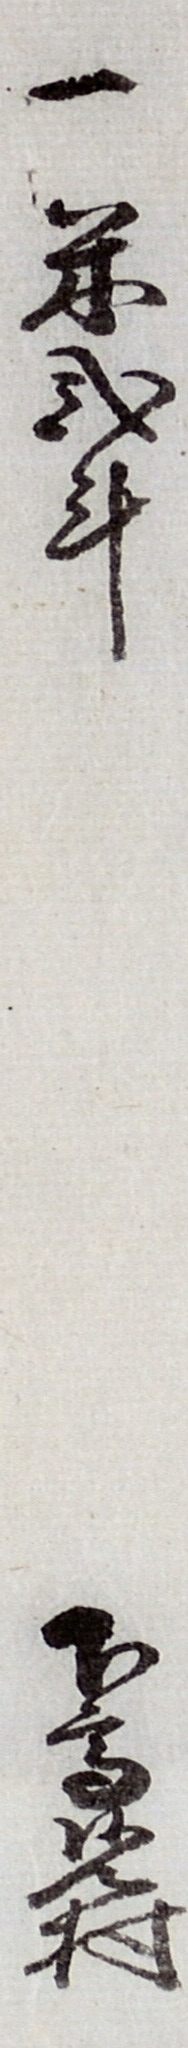一米弐斗下高見村
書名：官林下草御山代取立帳
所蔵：伊那市立高遠町図書館・合同会社AMANE
